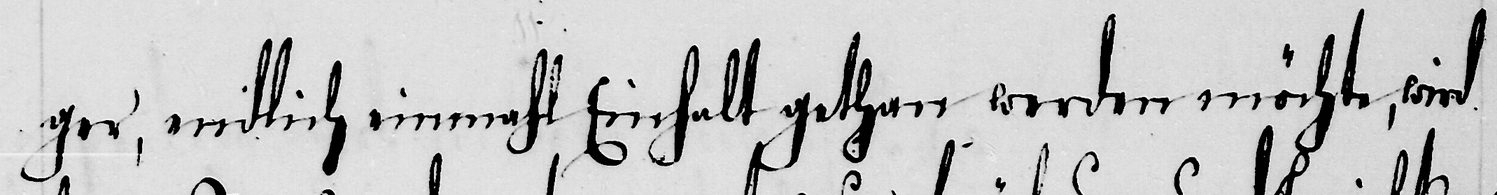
ger, endlich einmahl Einhalt gethan werden möchte, wird
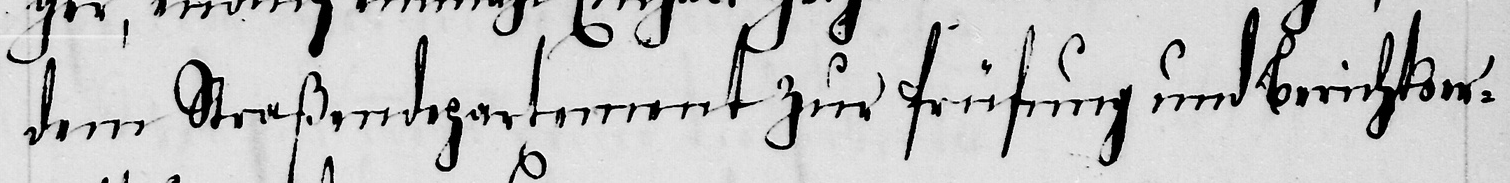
dem Straßendepartement zur Prüfung und Berichtser¬
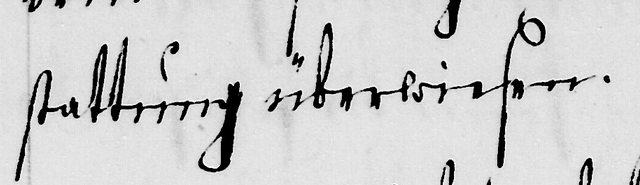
stattung überwiesen.
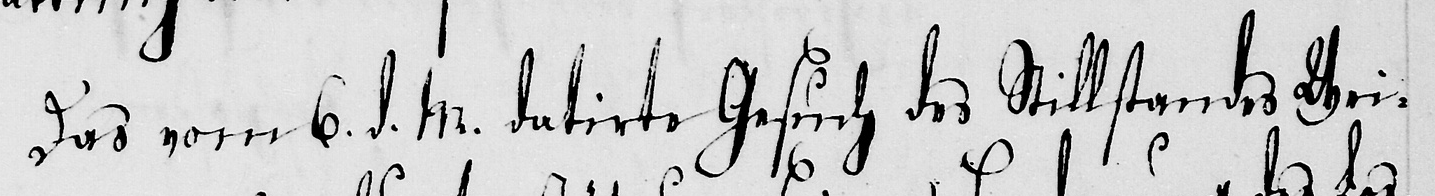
Das vom 6. d. M. datirte Gesuch des Stillstandes Wei¬
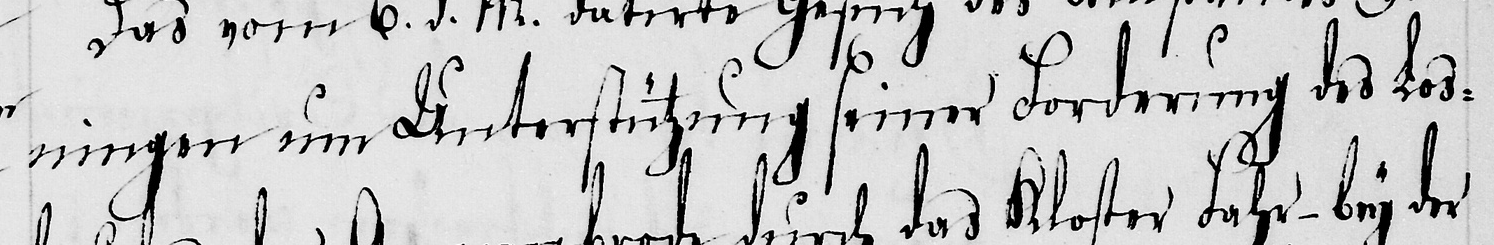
ningen um Unterstützung seiner Forderung des Los¬
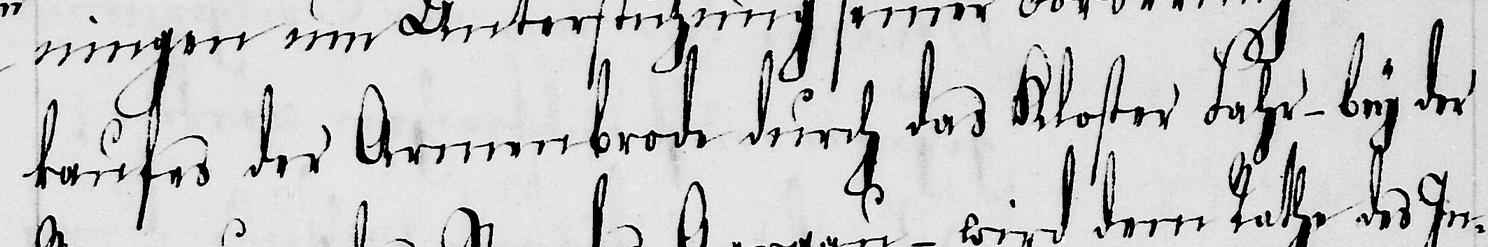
kaufes der Armenbrode durch das Kloster Fahr – bey
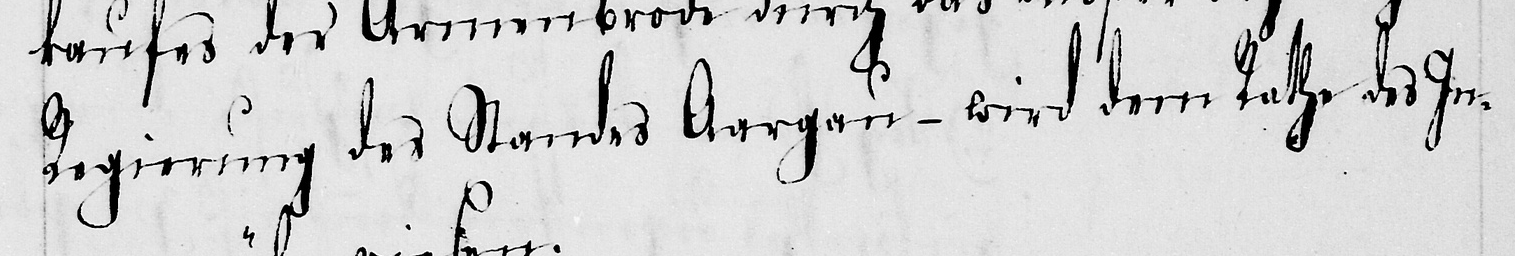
Regierung des Standes Aargau – wird dem Rathe des In¬
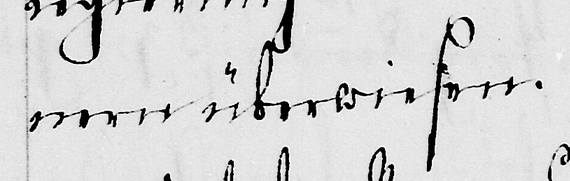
nern überwiesen.
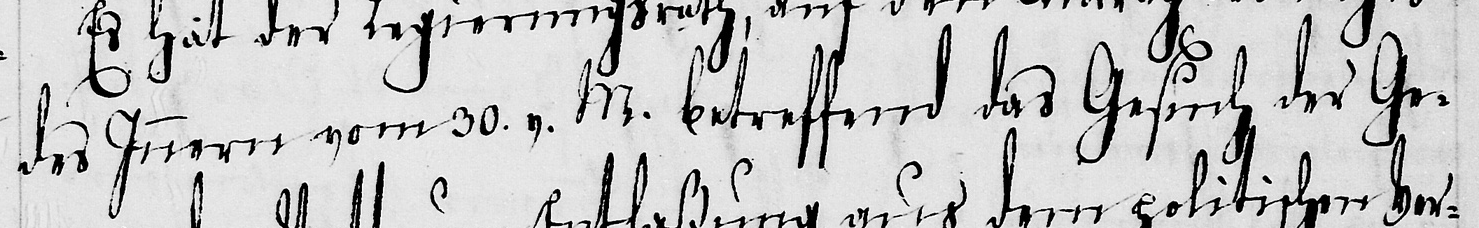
des Innern vom 30. v. M. betreffend das Gesuch der Ge¬
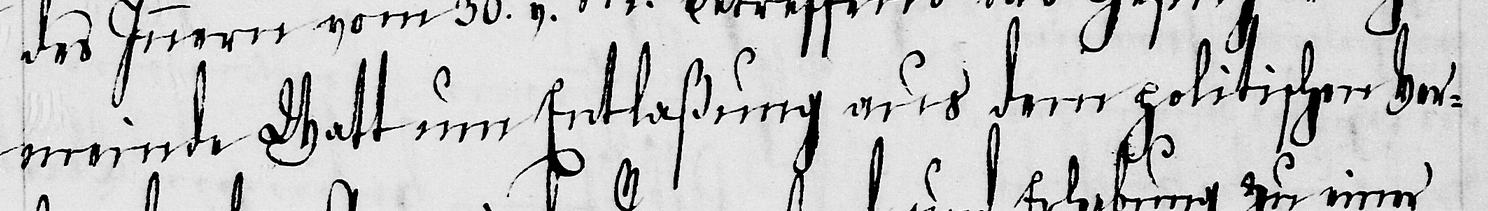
meinde Watt um Entlaßung aus dem politischen Ver¬
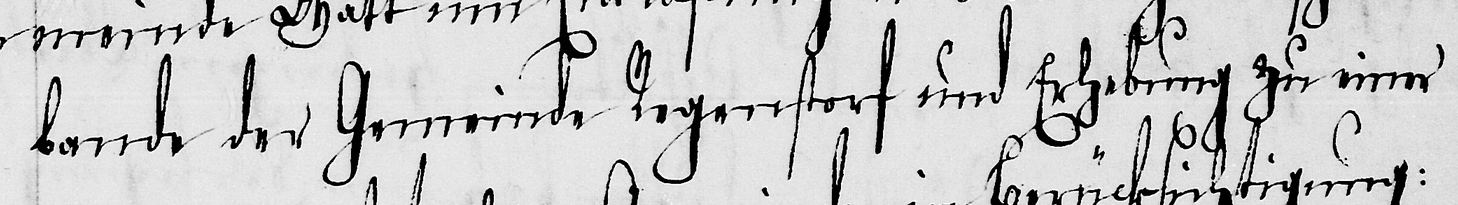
bande der Gemeinde Regenstorf und Erhebung zu einer
